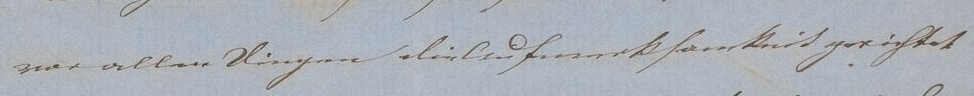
vor allen Dingen die Aufmerksamkeit gerichtet
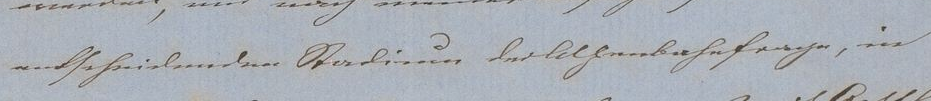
entscheidenden Stadium der Alpenbahnfrage, in
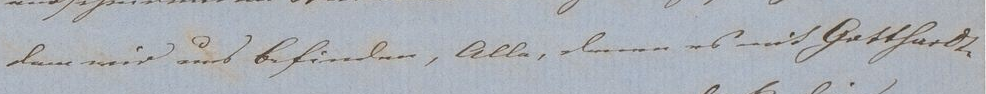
dem wir uns befinden, Alle, deren es mit Gotthardt
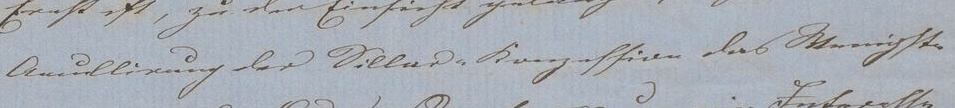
Anullirung der Sillar-Konzession das Wenigste
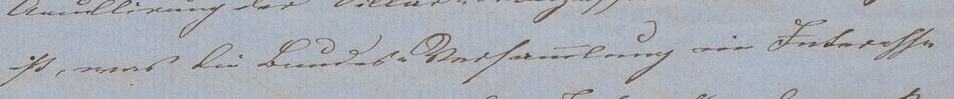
ist, was die Bundes-Versammlung im Interesse
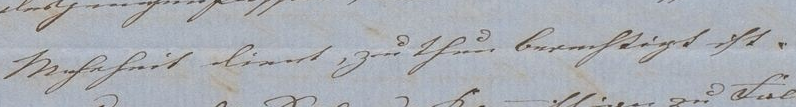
Mehrheit dient, zu thun berechtigt ist. –
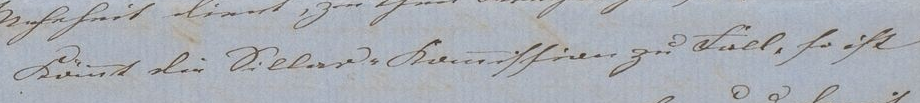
Kömmt die Sillar-Konmmission zu Fall, so ist
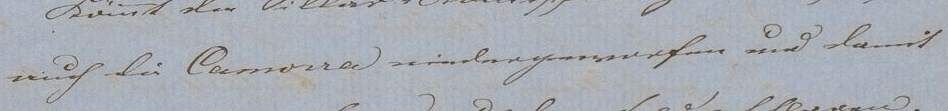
auch die Camorra niedergeworfen und damit
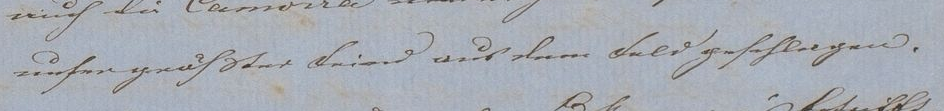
unser größter Fein aus dem Feld geschlagen.
